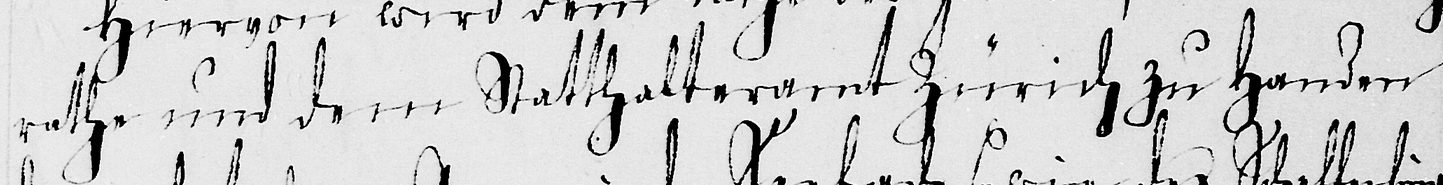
rathe und dem Statthalteramt Zürich zu Handen
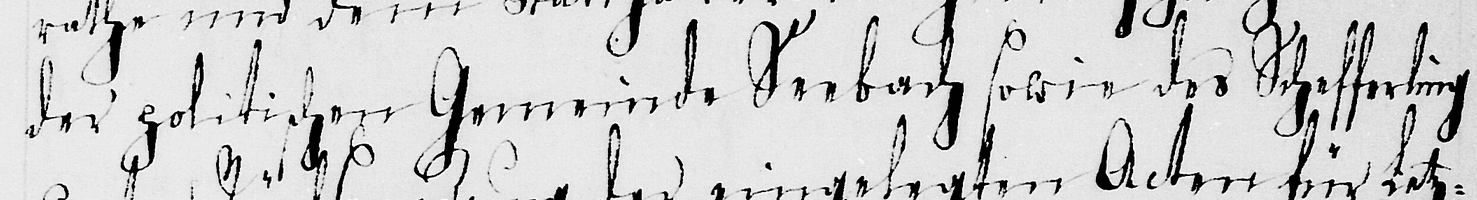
der politischen Gemeinde Seebach sowie des Schefferl¬
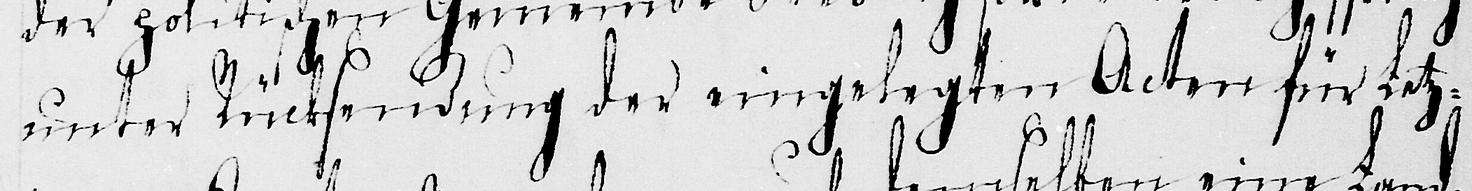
unter Rücksendung der eingelegten Acten für Letz¬
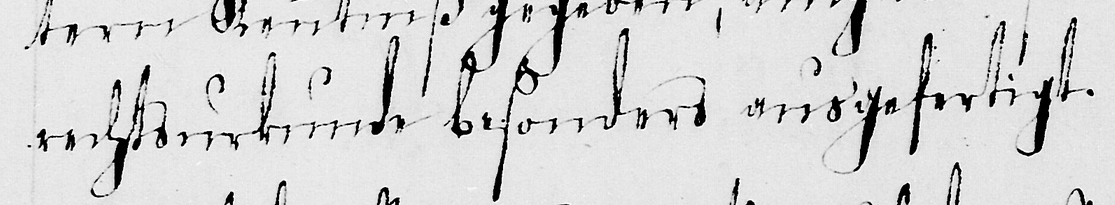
rechtsurkunde besonders ausgefertigt.
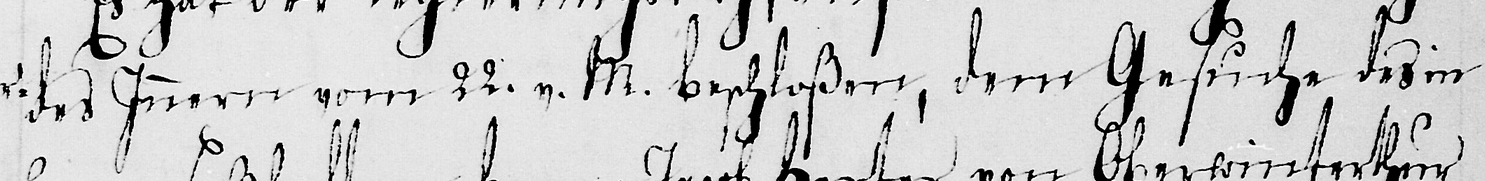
des Innern vom 22 v. M. beschloßen, dem Gesuche des in
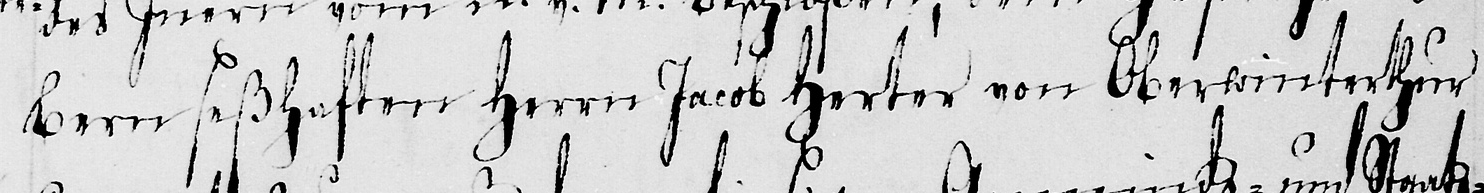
Bern seßhaften Herrn Jacob Herter von Oberwinterthur
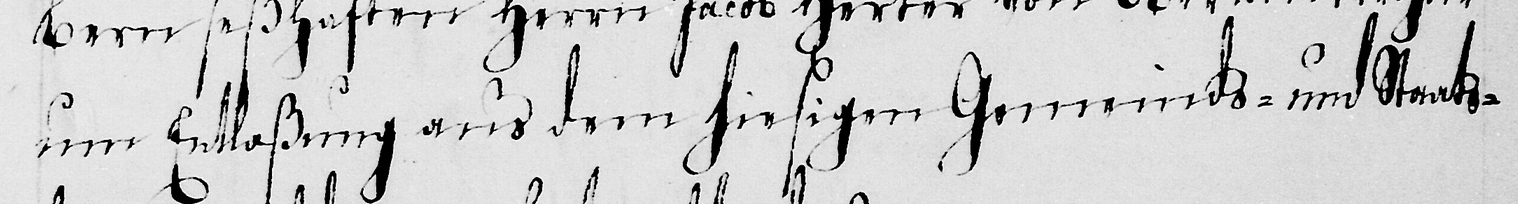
um Entlaßung aus dem hiesigen Gemeinds- und Staats¬
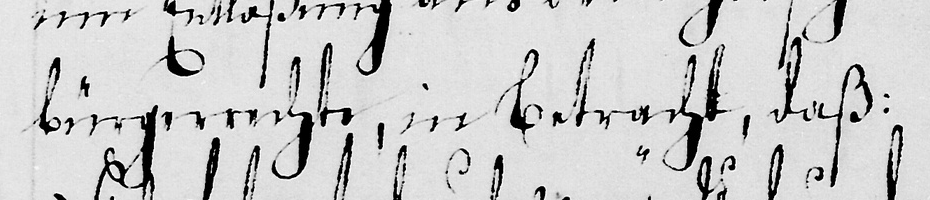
bürgerrechte, in Betracht daß:
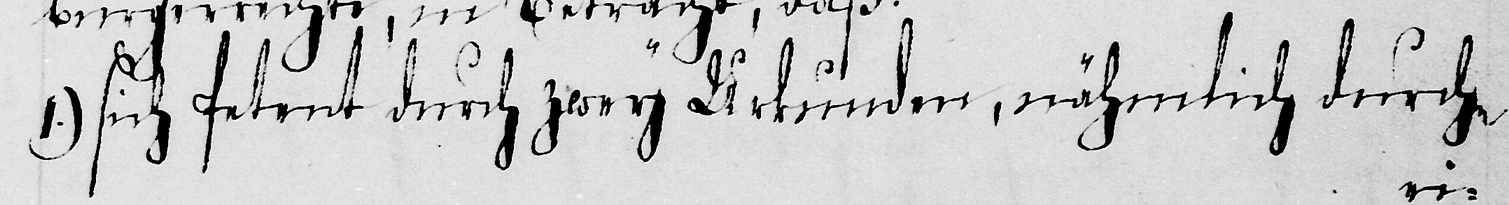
sich Petent durch zwey Urkunden, nämlich durch
